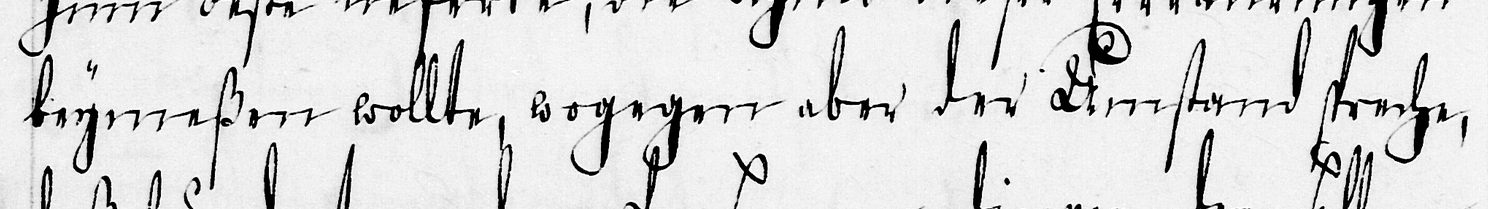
beymeßen wollte, wogegen aber der Umstand spreche,
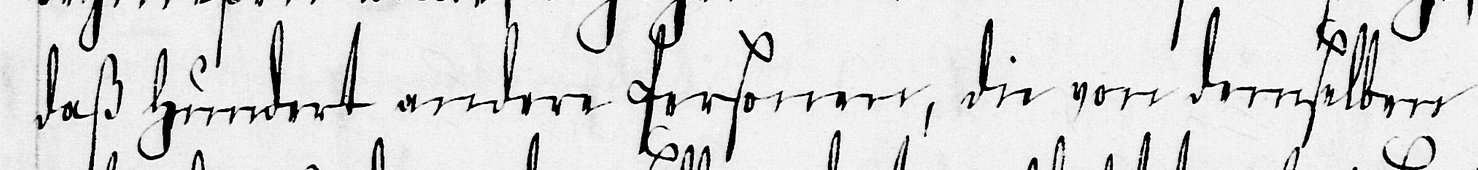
daß hundert andere Personen, die von demselben
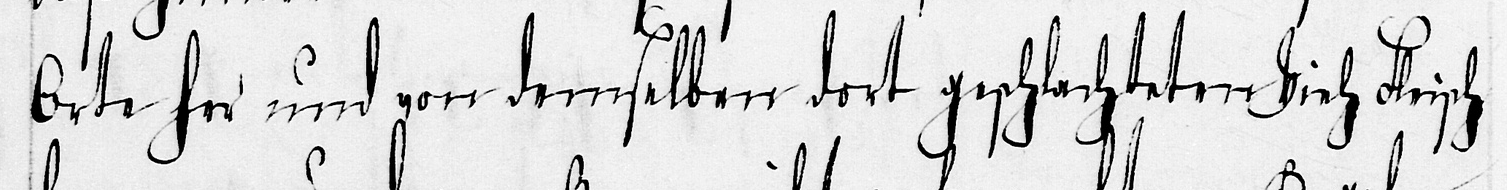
Orte her und von demselben dort geschlachteten Vieh Flei¬
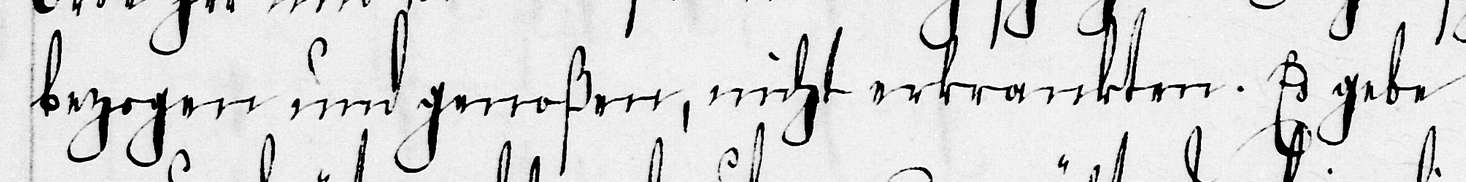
bezogen und genoßen, nicht erkrankten. Es gebe
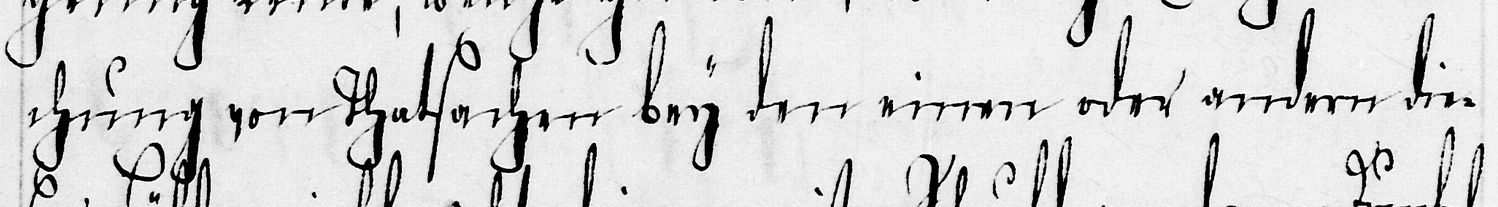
chung von Thatsachen bey den einen oder andern die¬
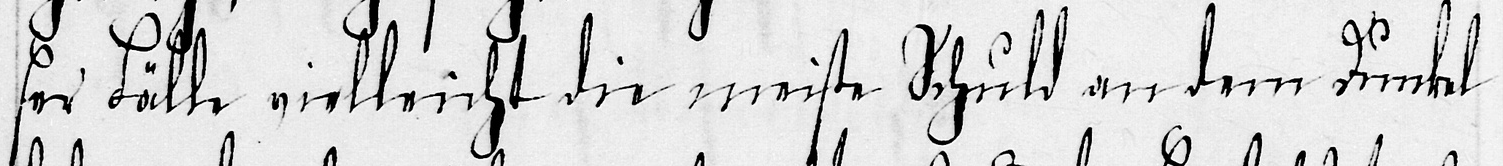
ser Fälle vielleicht die meiste Schuld an dem Dunkel
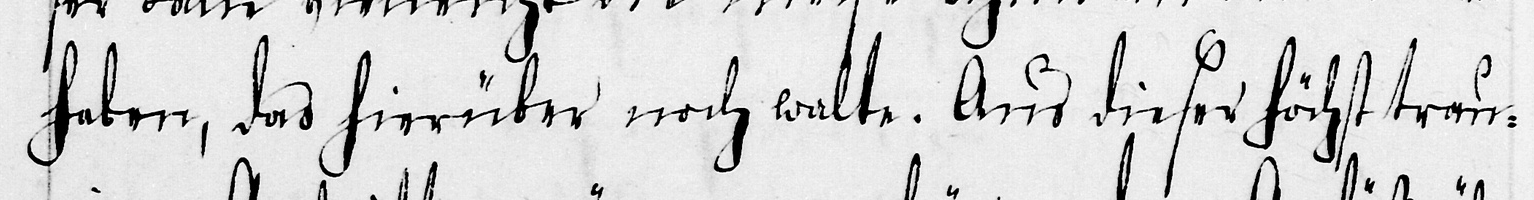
haben, das hierüber noch walte. Aus dieser höchst trau¬
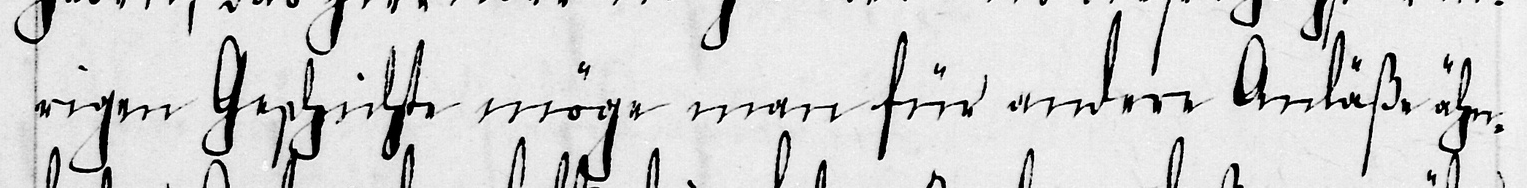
rigen Geschichte möge man für andere Anläße ähn¬
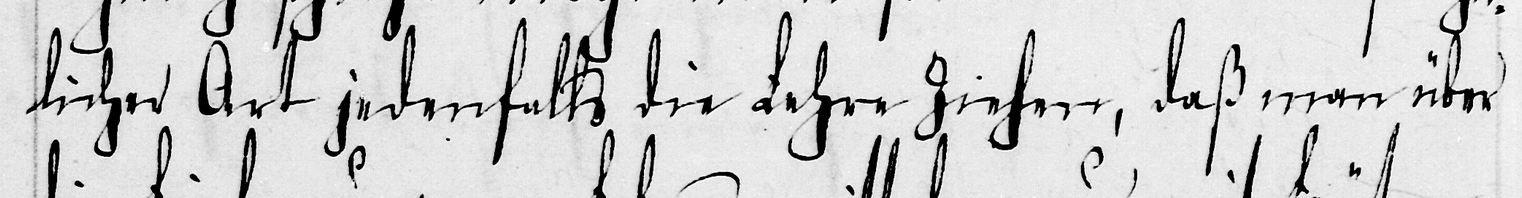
licher Art jedenfalls die Lehre ziehen, daß man über
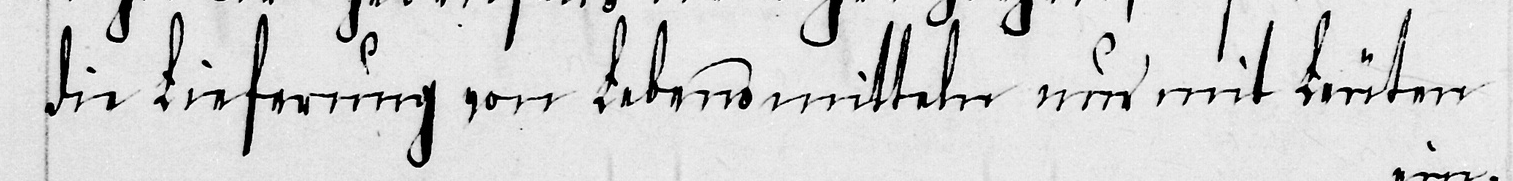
die Lieferung von Lebensmitteln nur mit Leuten
